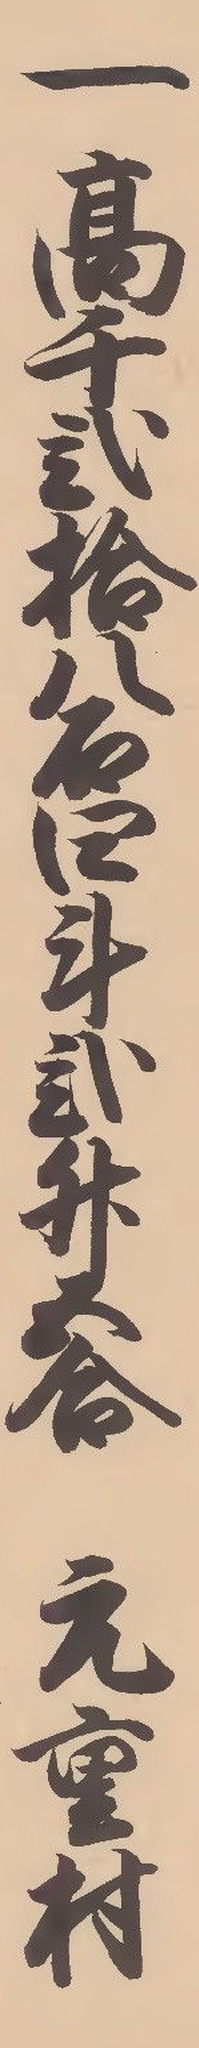一髙千弐拾八石四斗弐升五合元重村
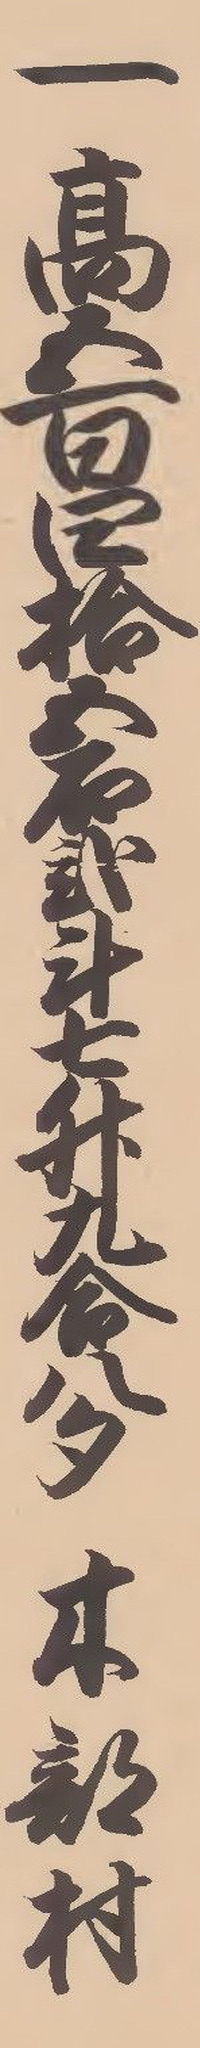一髙五百四拾五石弐斗七升九合八夕木部村
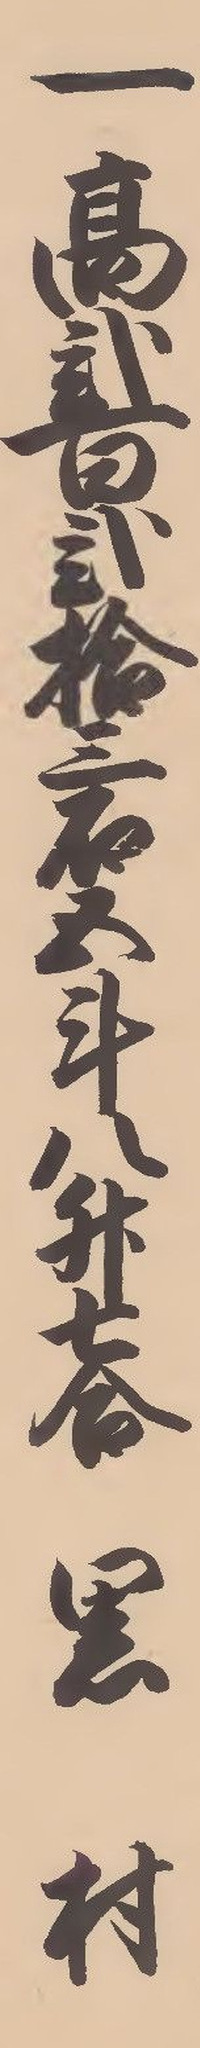一髙弐百弐拾三石五斗八升七合黑村
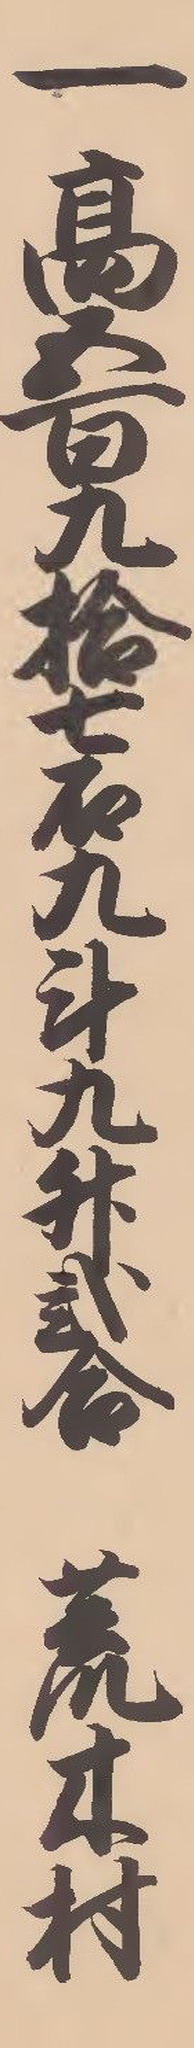一髙五百九拾七石九斗九升壱合荒木村
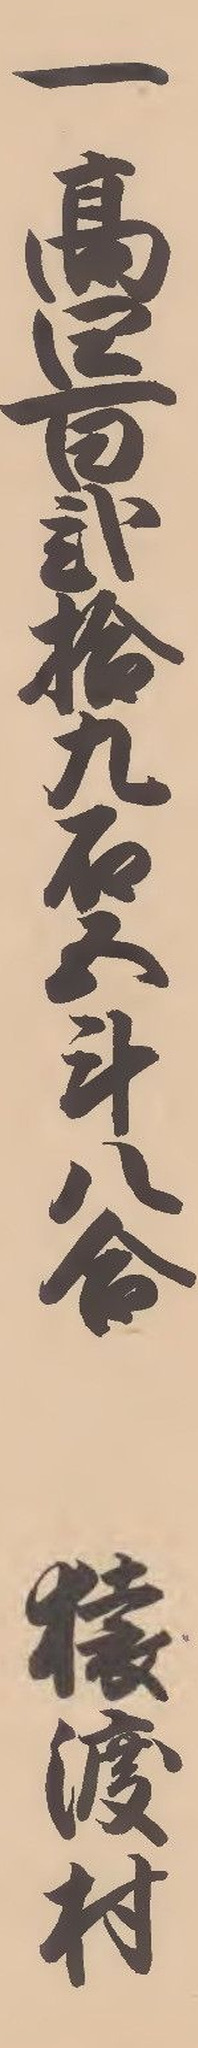一髙四百弐拾九石五斗八合猿渡村
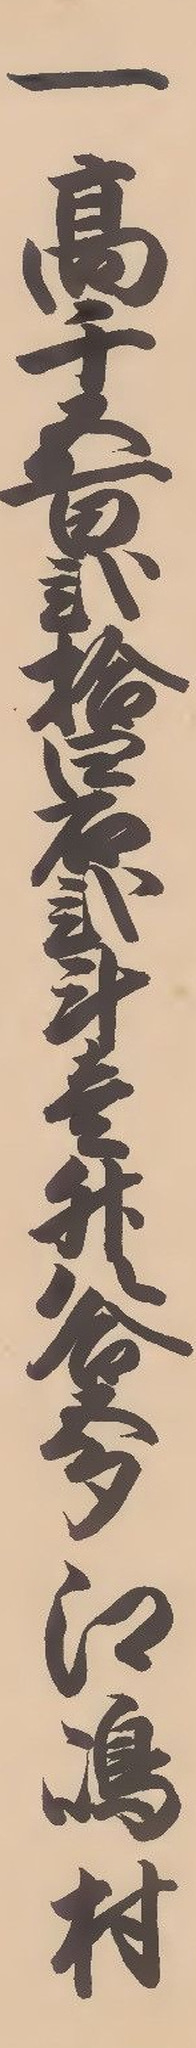一髙千五百弐拾四石弐斗壱升八合五夕江嶋村
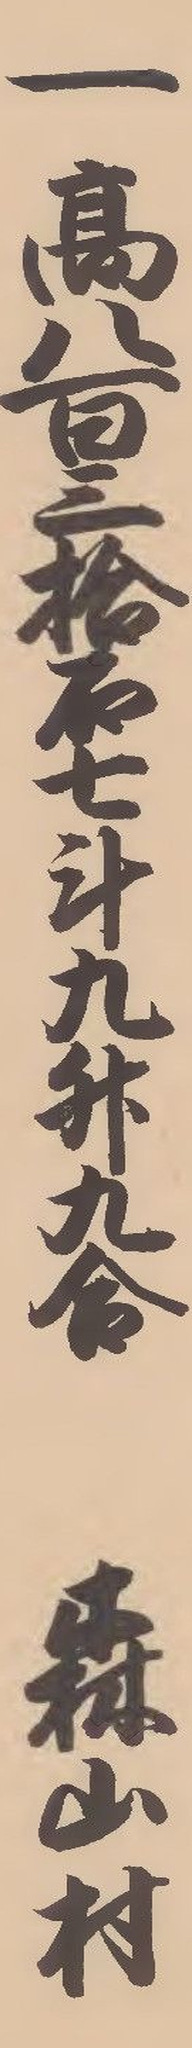一髙八百三拾石七斗九升九合森山村
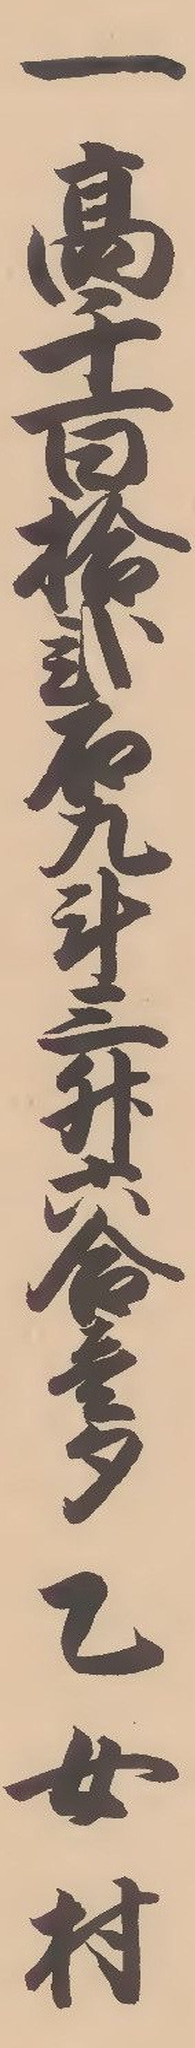一髙千百拾弐石九斗三升六合壱夕乙女村

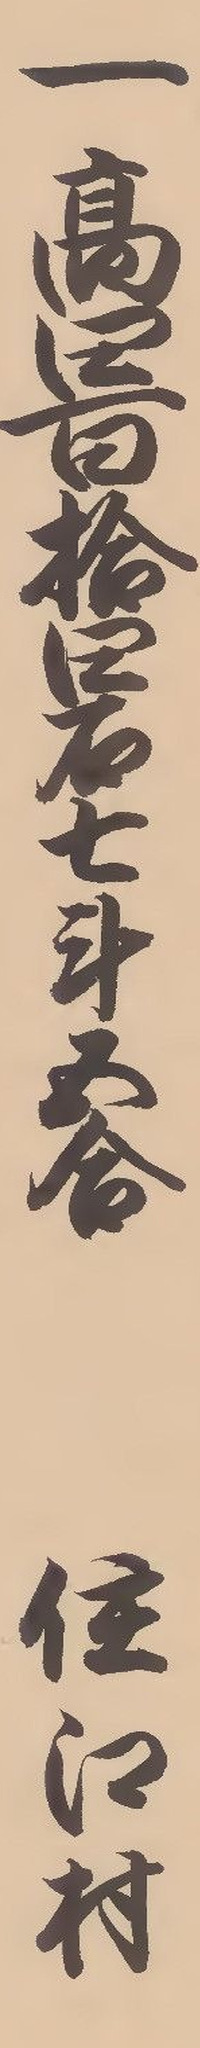一髙四百拾四石七斗五合住江村
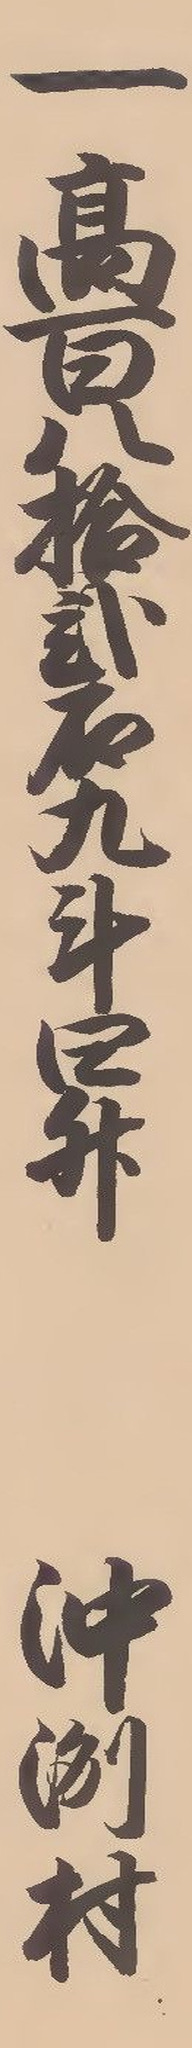一髙百八拾弐石九斗四升沖洲村
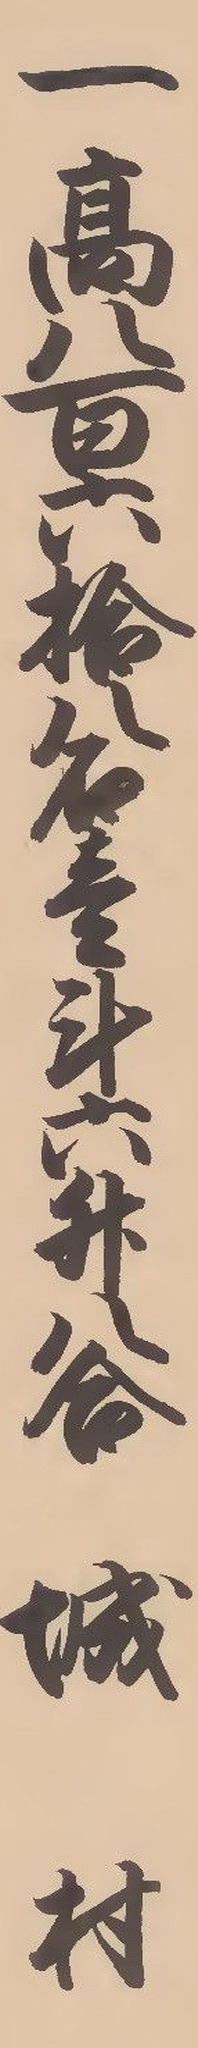一髙八百六拾八石壱斗六升八合城村
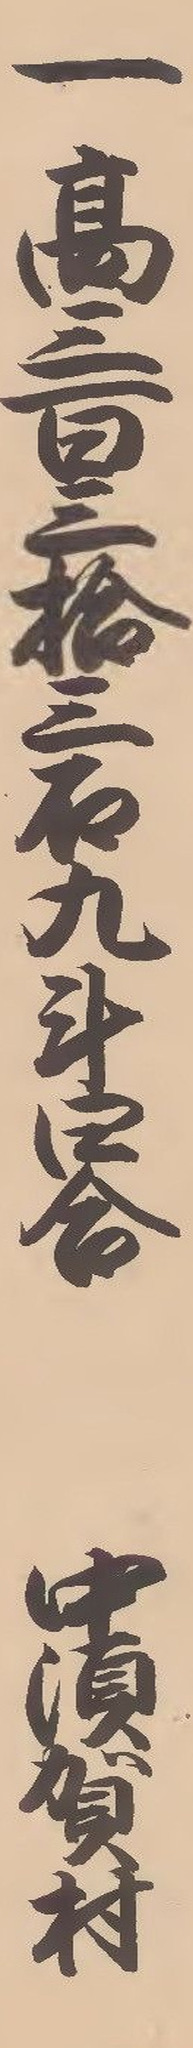一髙三百三拾三石九斗四合中須賀村
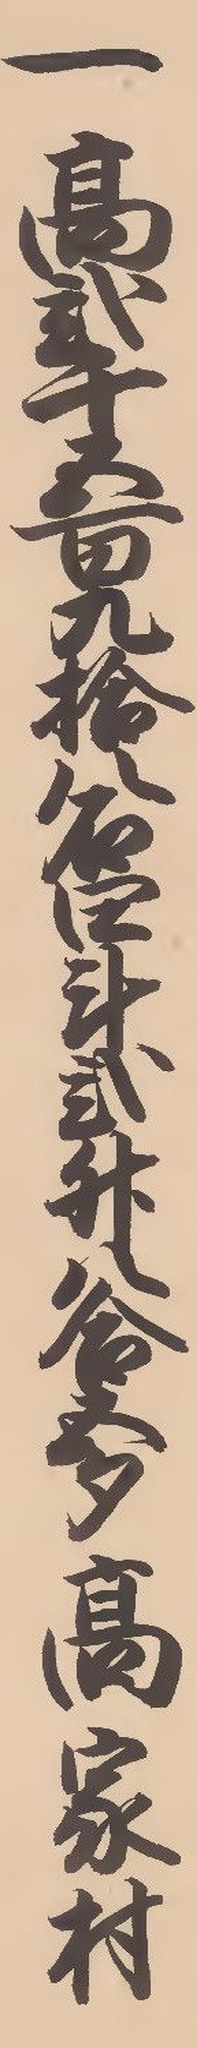一髙弐千五百九拾八石四斗弐升八合五夕
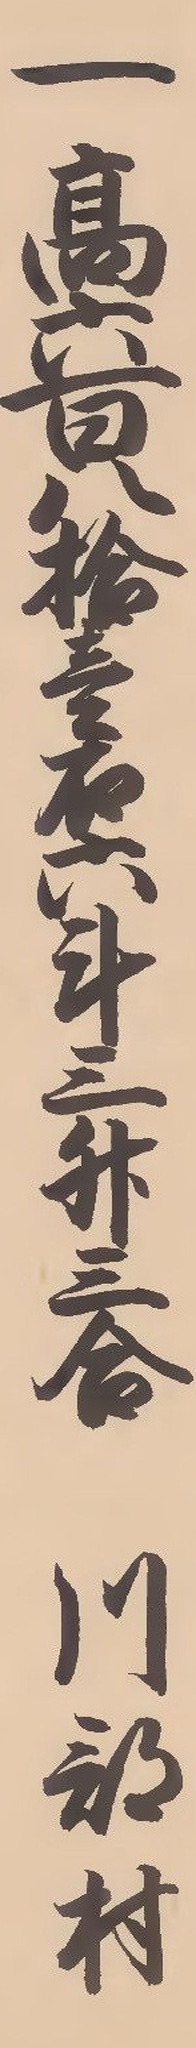一髙六百八拾壱石六斗三升三合川部村
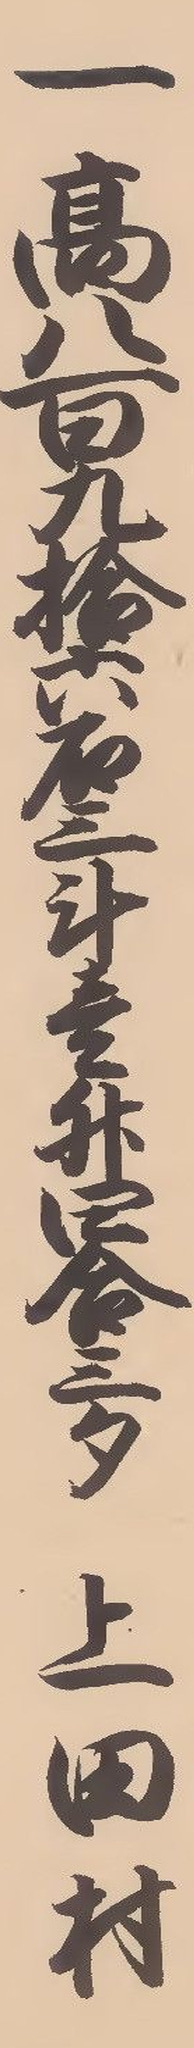一髙八百九拾六石三斗壱升四合三夕上田村
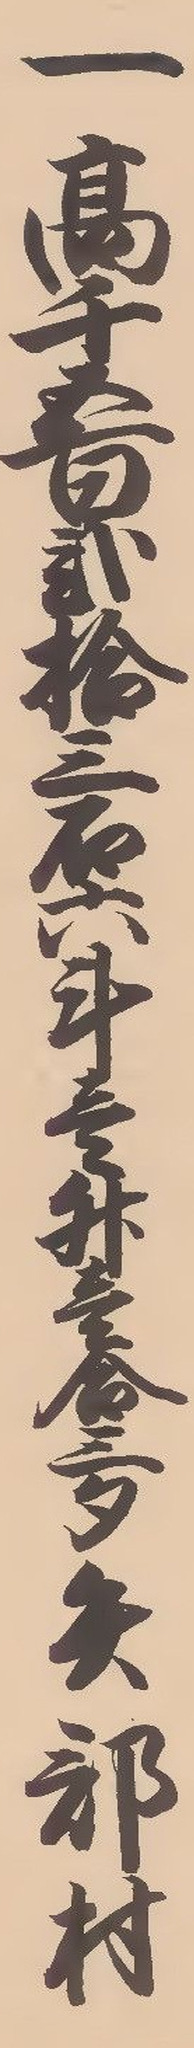一髙千五百弐拾三石六斗壱升壱合三夕矢部村
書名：豊前国郷帳
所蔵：国立公文書館 National Archives of Japan
